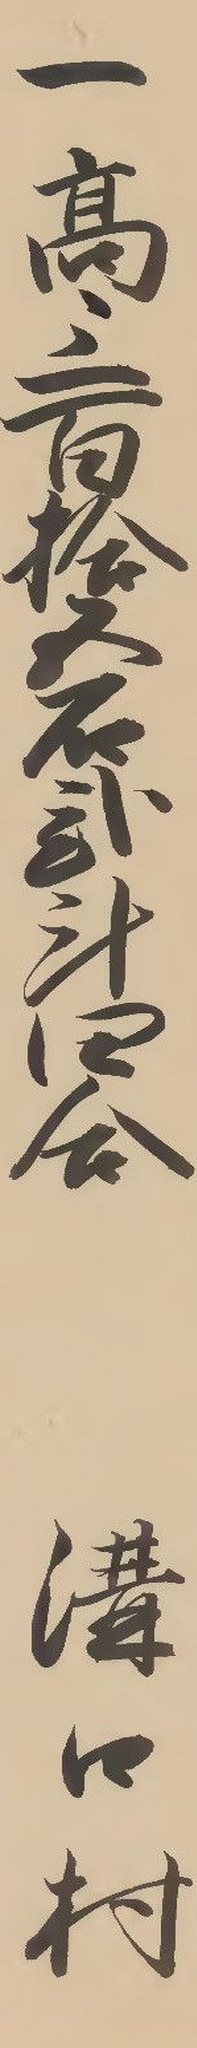一高三百拾五石弐斗四合溝口村
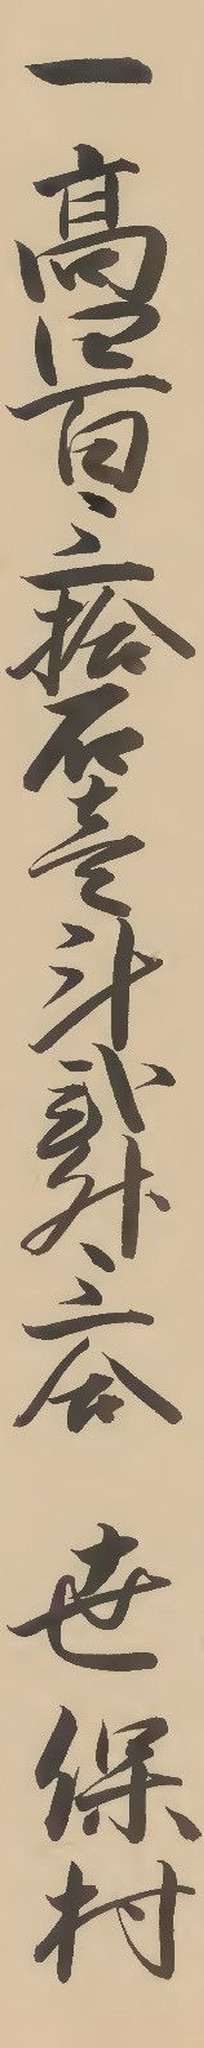一高四百三拾石壱斗弐升三合世保村
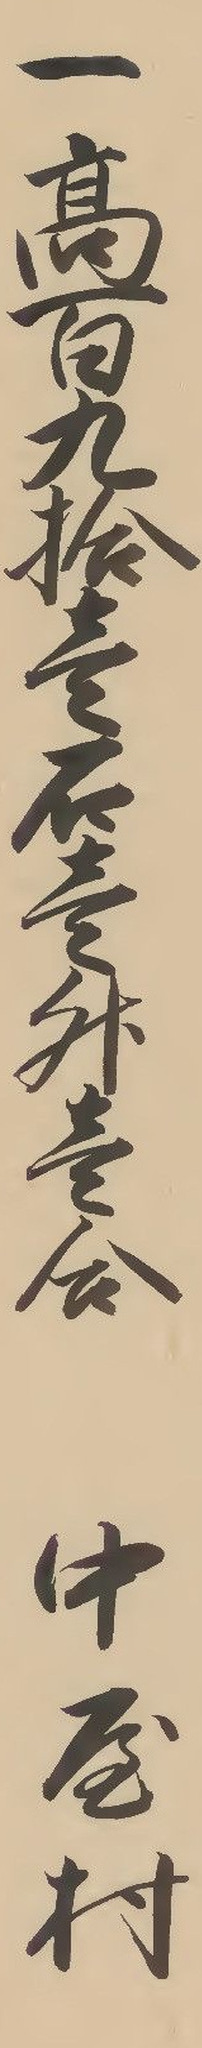一高百九拾壱石壱升壱合中屋村

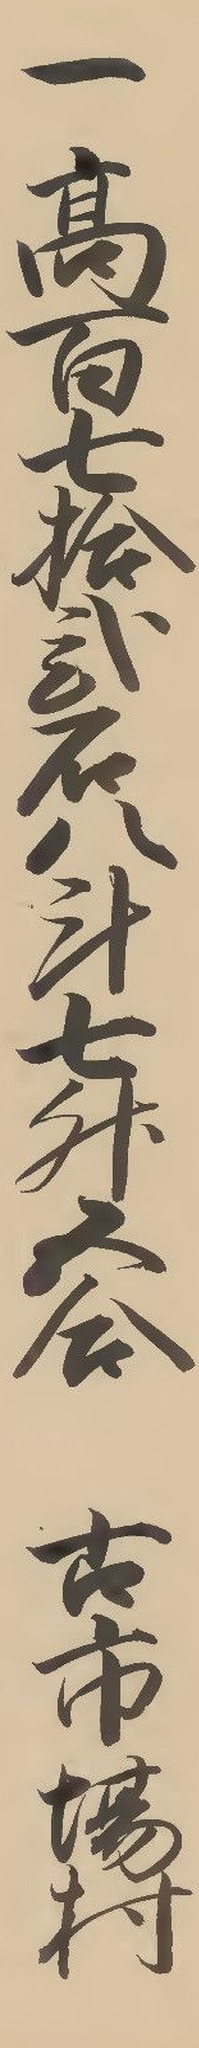一高百七拾弐石八斗七升五合古市場村
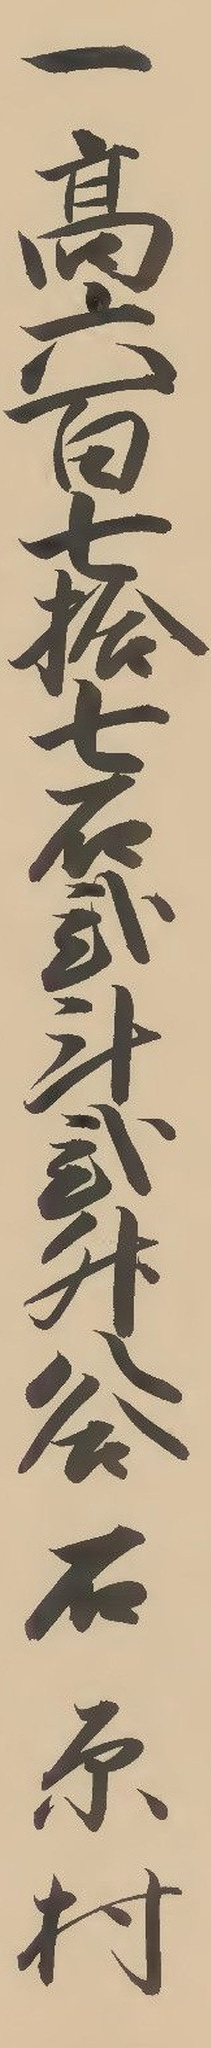一高六百七拾七石弐斗弐升八合石原村
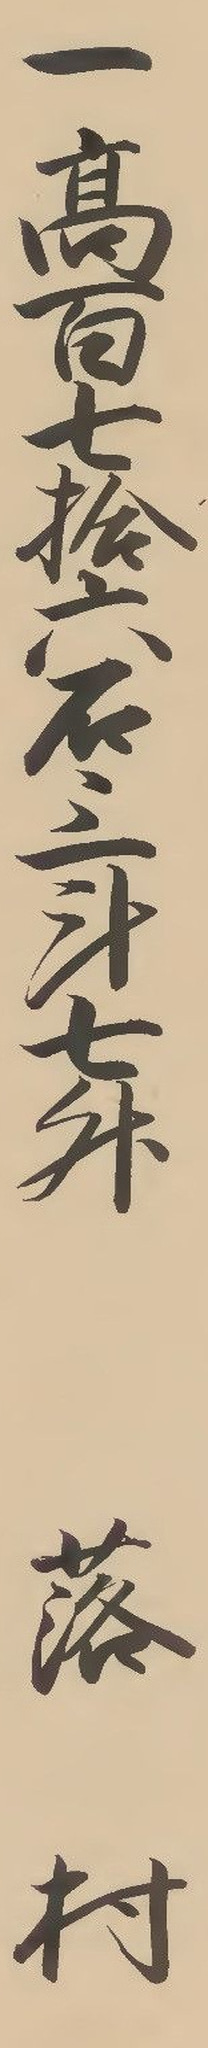一高百七拾六石三斗七升落村
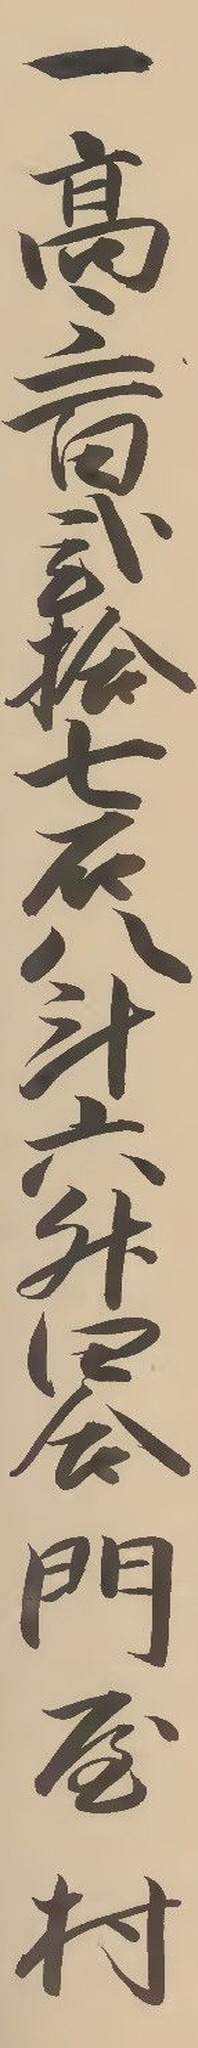一高三百弐拾七石八斗六升四合門屋村
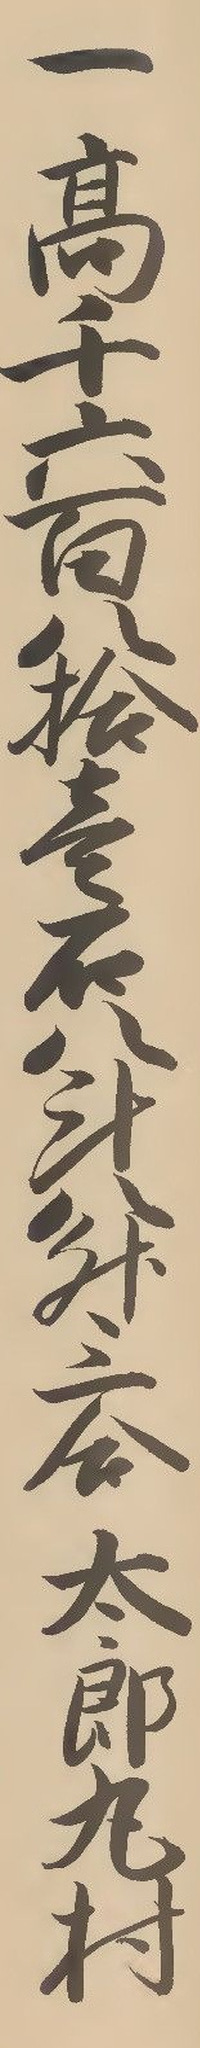一高千六百八拾壱石八斗八升三合太郎丸村
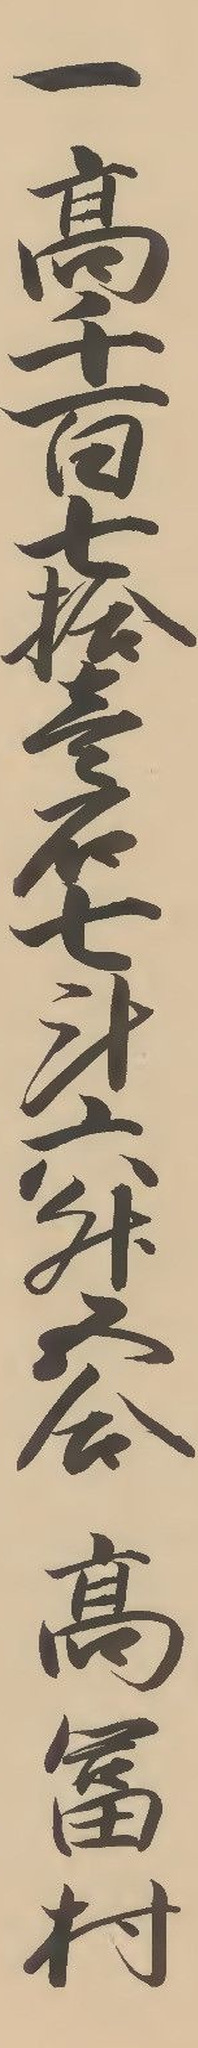一高千百七拾壱石七斗六升五合高富村
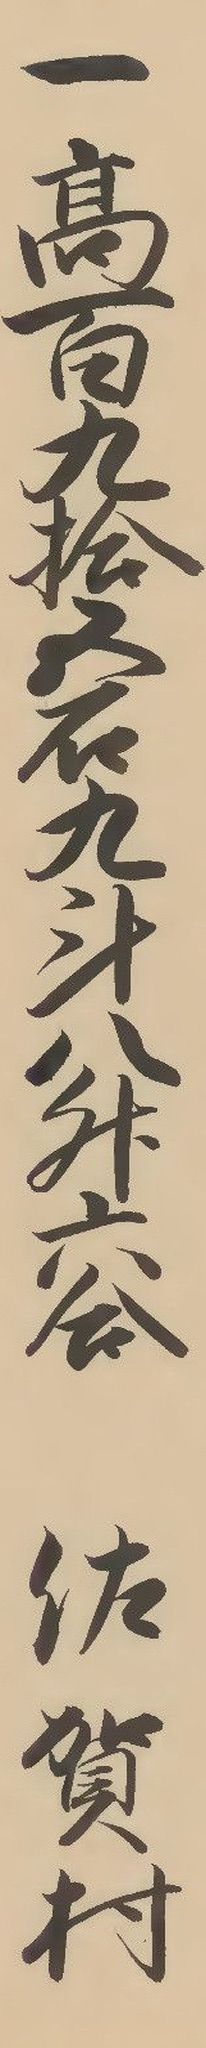一高百九拾五石九斗八升六合佐賀村

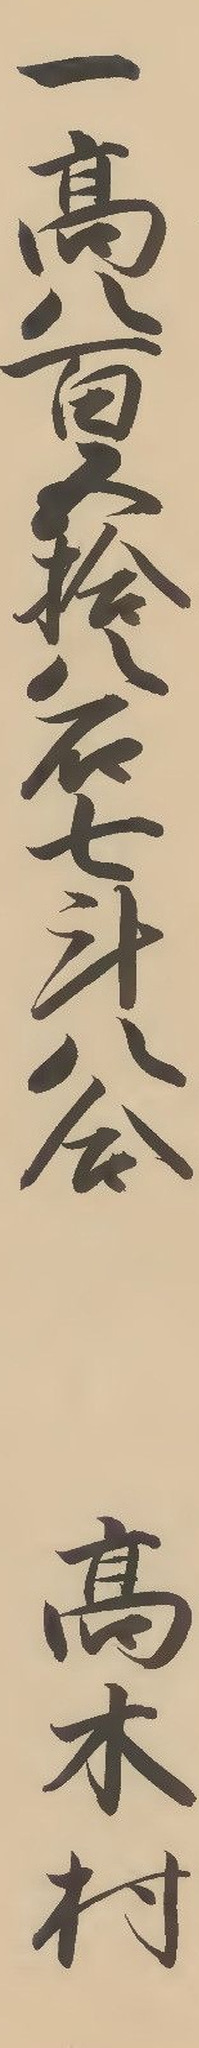一高八百五拾八石七斗八合高木村
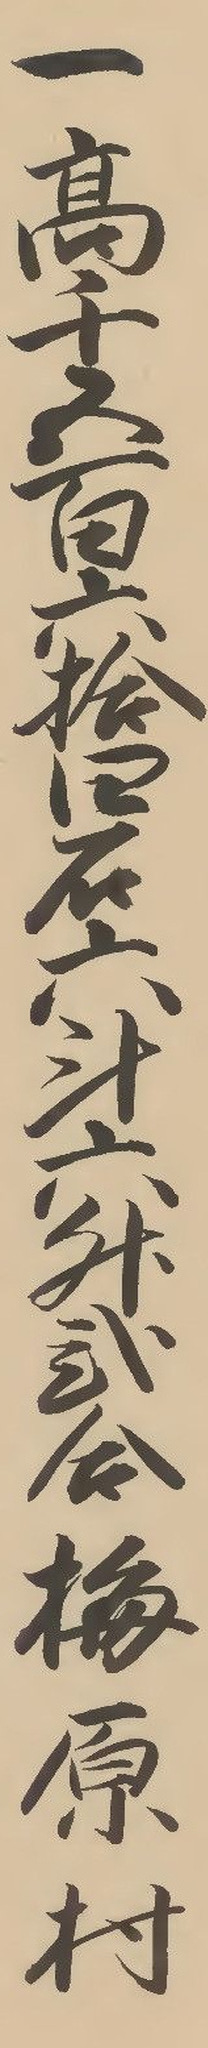一高千五百六拾四石六斗六升弐合梅原村
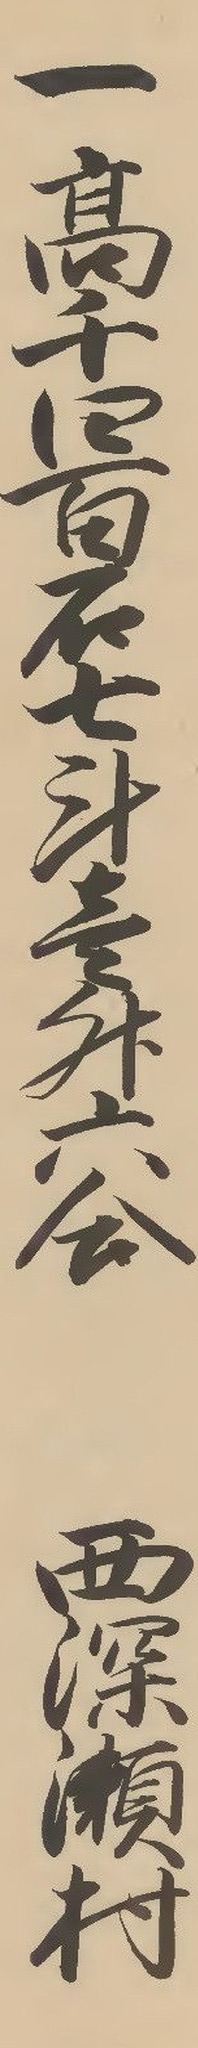一高千四百石七斗壱升六合西深瀬村
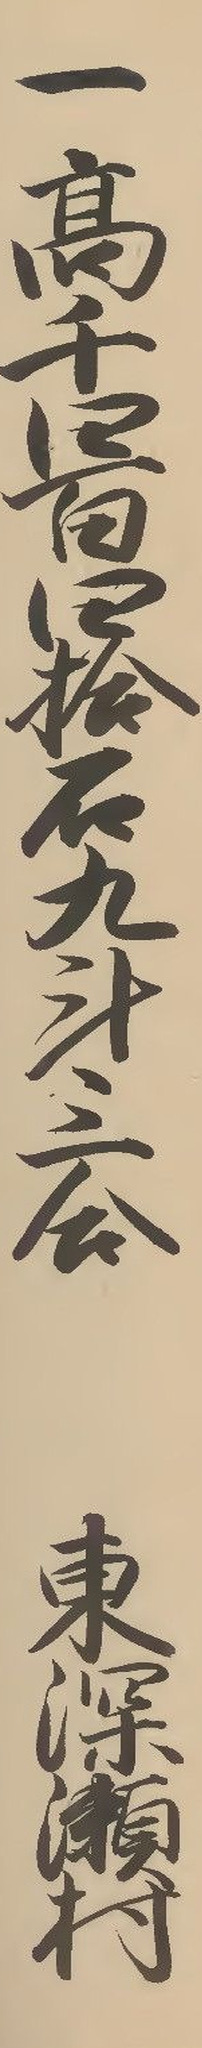一高千四百四拾石九斗三合東深瀬村
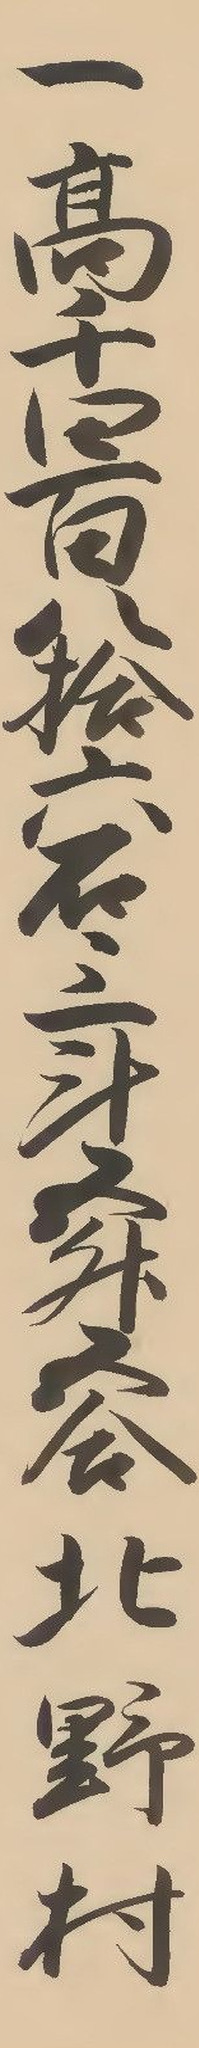一高千四百八拾六石三斗五升五合北野村
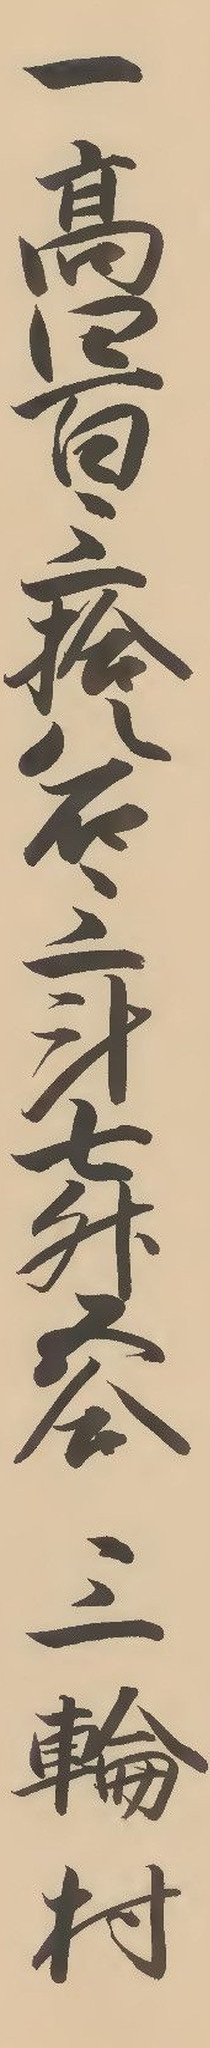一高四百三拾八石三斗七升五合三輪村
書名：美濃国郷帳
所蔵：国立公文書館 National Archives of Japan
